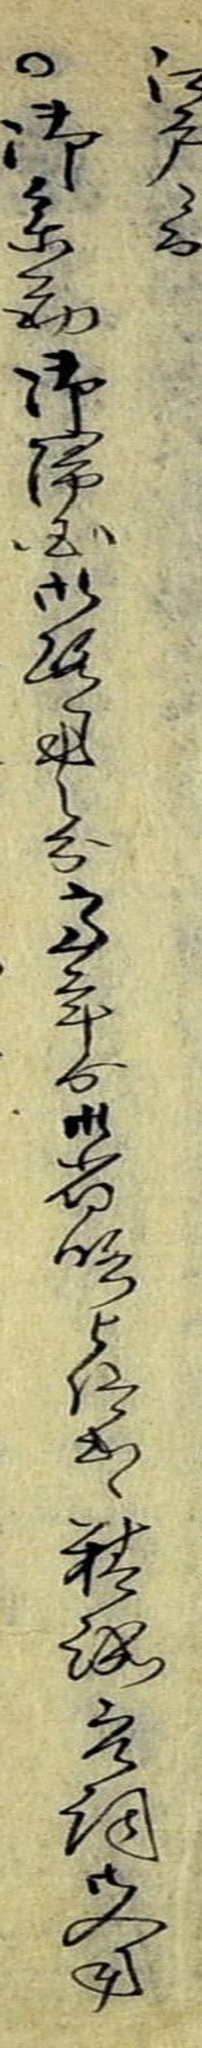○御参勤御帰国御路用之分当年ゟ御省略被仰出候精誠取調御入用
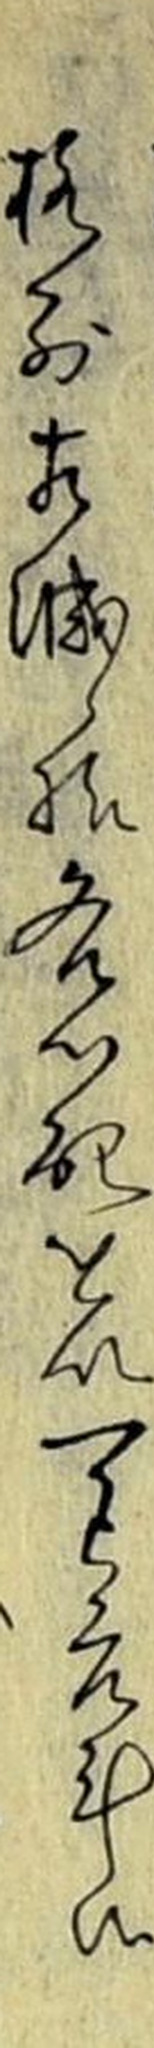格別相減候様各心配を以可被取斗候
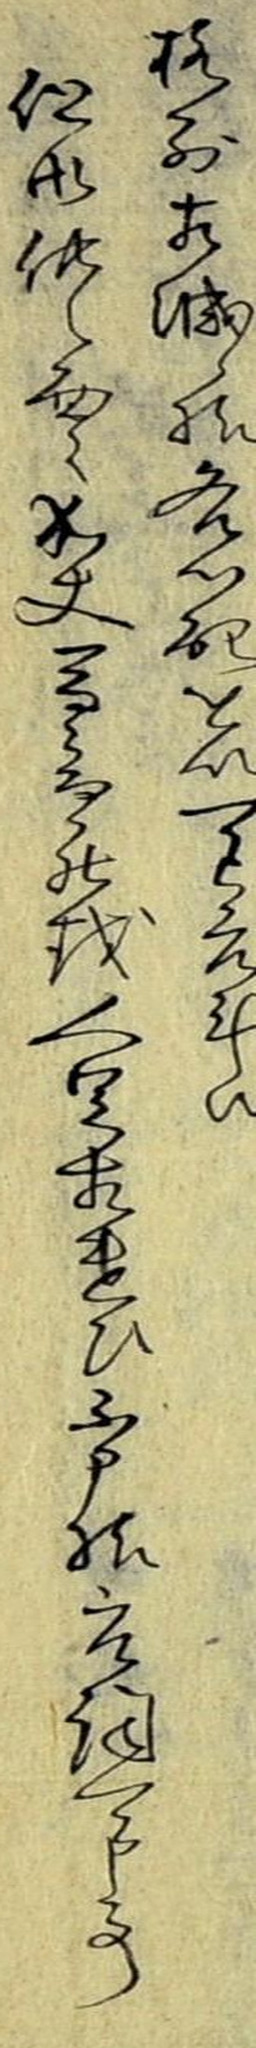但御供之面々成丈馬に而罷越人足相遣ひ不申様取調可申事

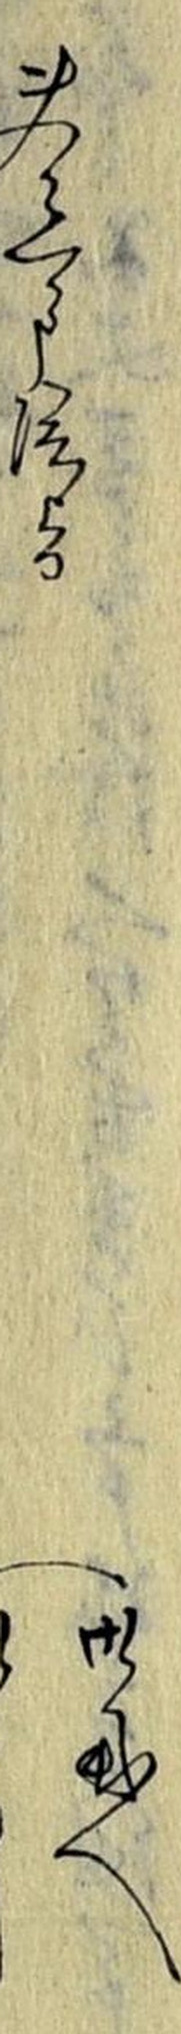夫々可被申渡旨御用人
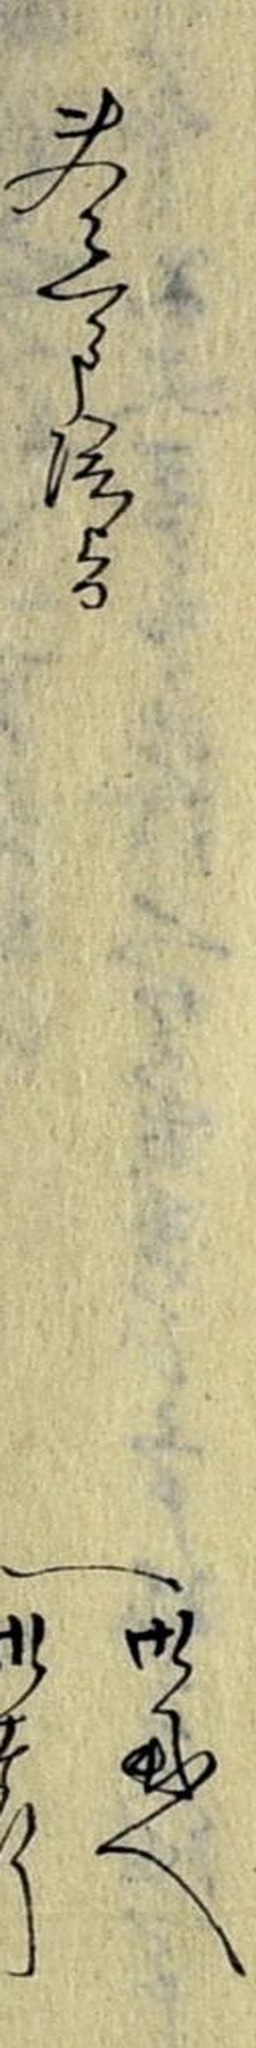夫々可被申渡旨御用人
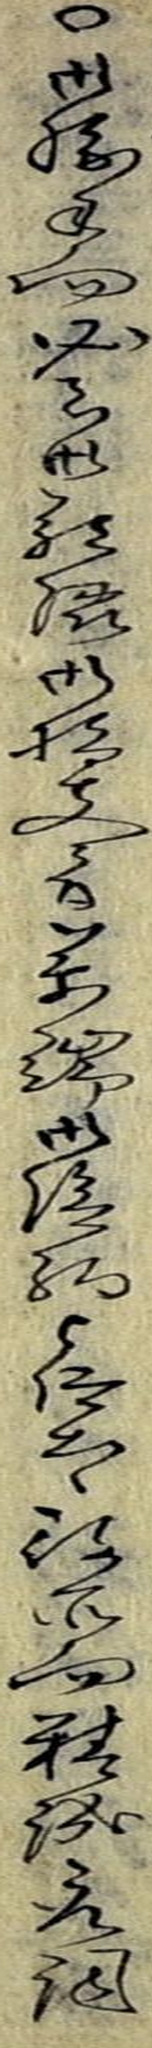○御勝手向必至御難渋御指支に付万端御倹約被仰出候役所向精誠取調
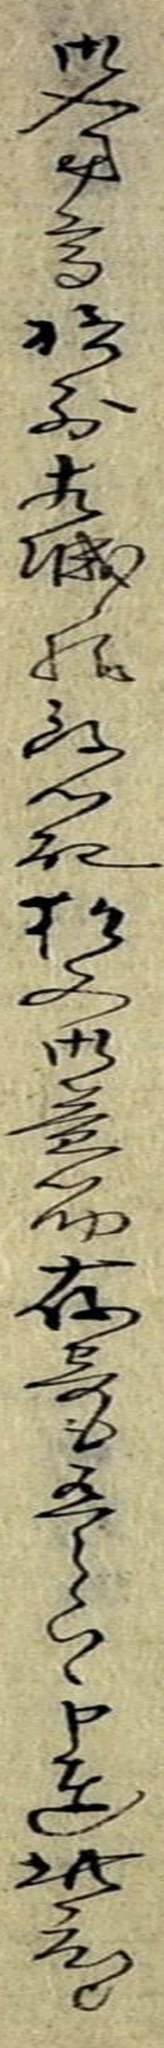御入用高格別相減候様致心配猶又御益筋存寄も有之候はヽ申達此度被
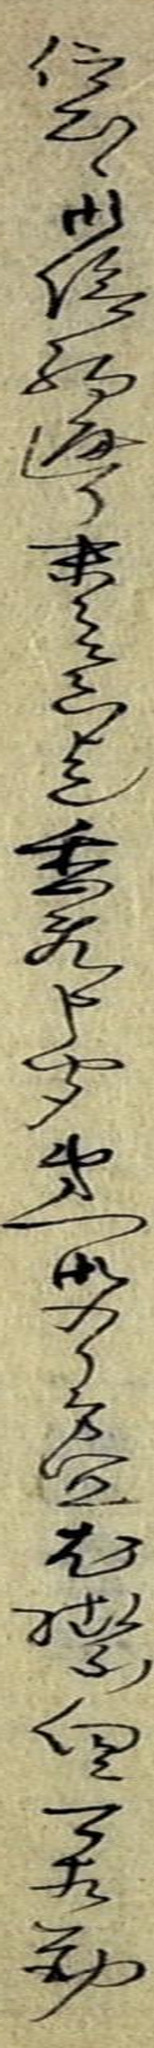仰出候御倹約通り末々に至迄委敷申聞第一御〆り方宜尤潔白可相勤
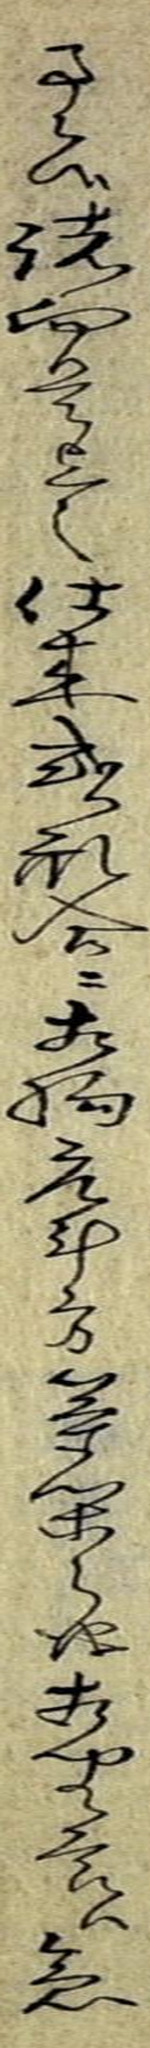事に候諸向是迄之仕来或は形合に相拘取斗方等閑之儀相聞候節は急
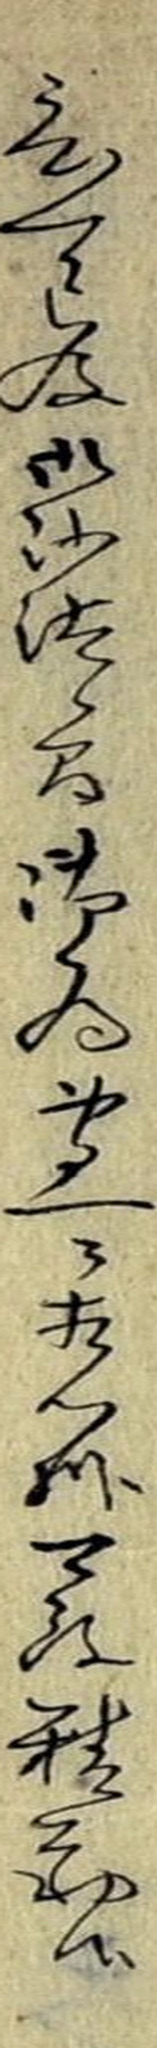度可被及御沙汰候間御為第一に相心掛可致精勤候
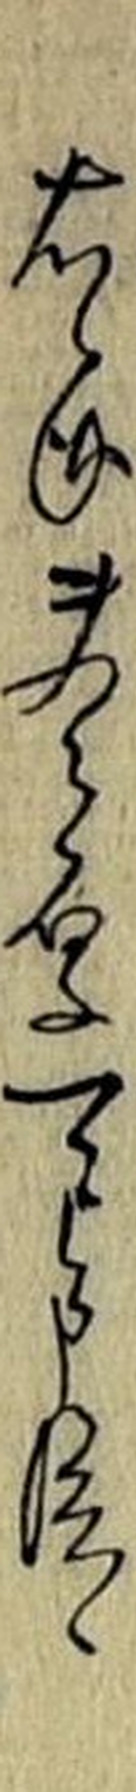右之趣夫々厚可被申渡候
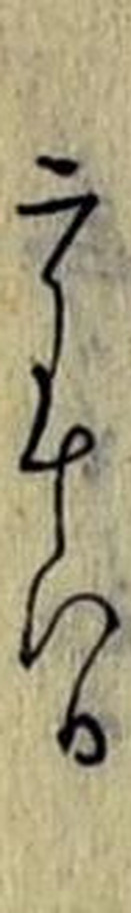二月十八日
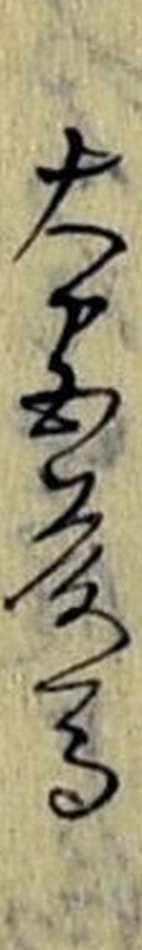大宮藤馬
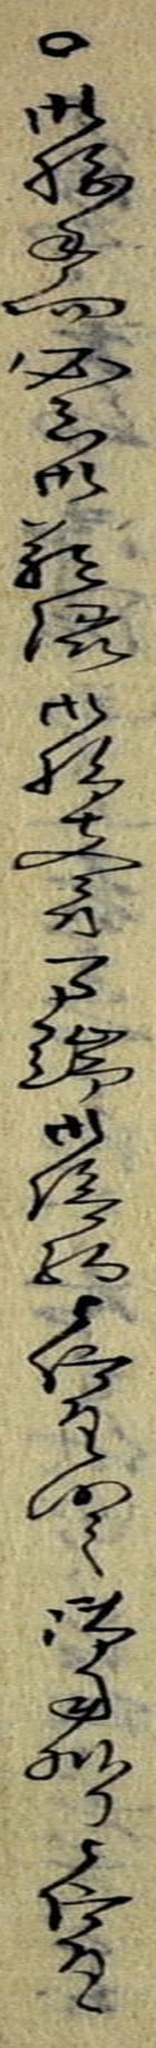○御勝手向必至御難渋御指支に付万端御倹約被仰出候仍之御用掛り被仰付候
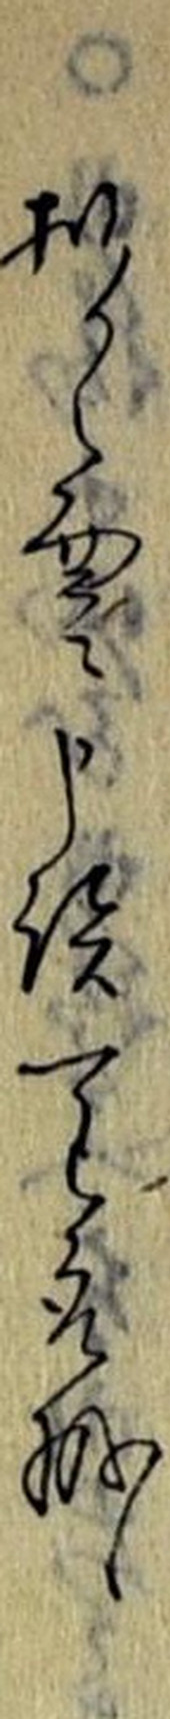掛り之面々申談可取扱候
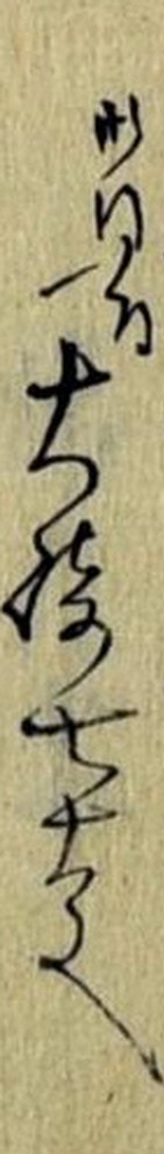御目付大崎七太夫
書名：命令之部 四
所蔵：福井県文書館 Fukui Prefectural Archives
